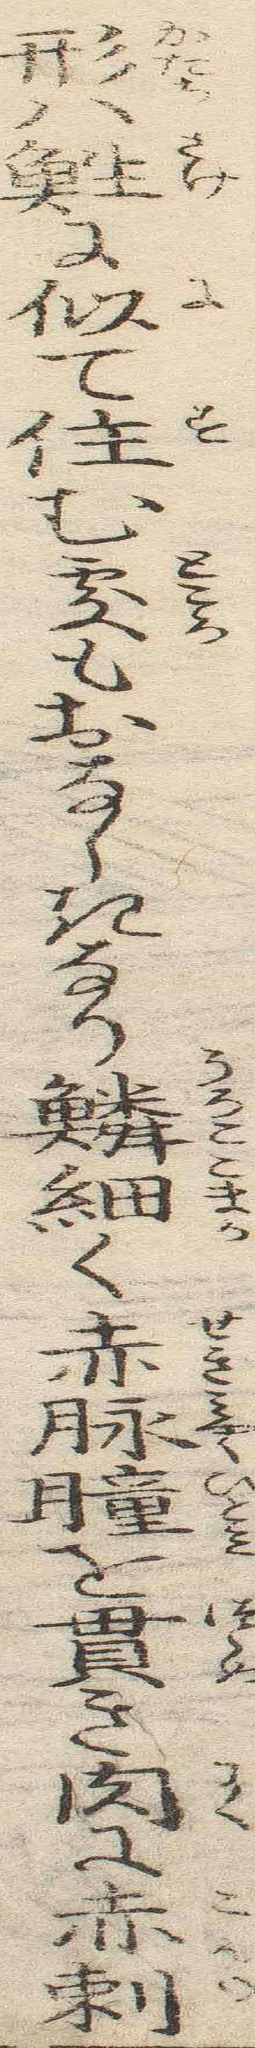形は鮭に似て住む処もおなしきなり鱗細く赤脈瞳を貫き肉に赤刺
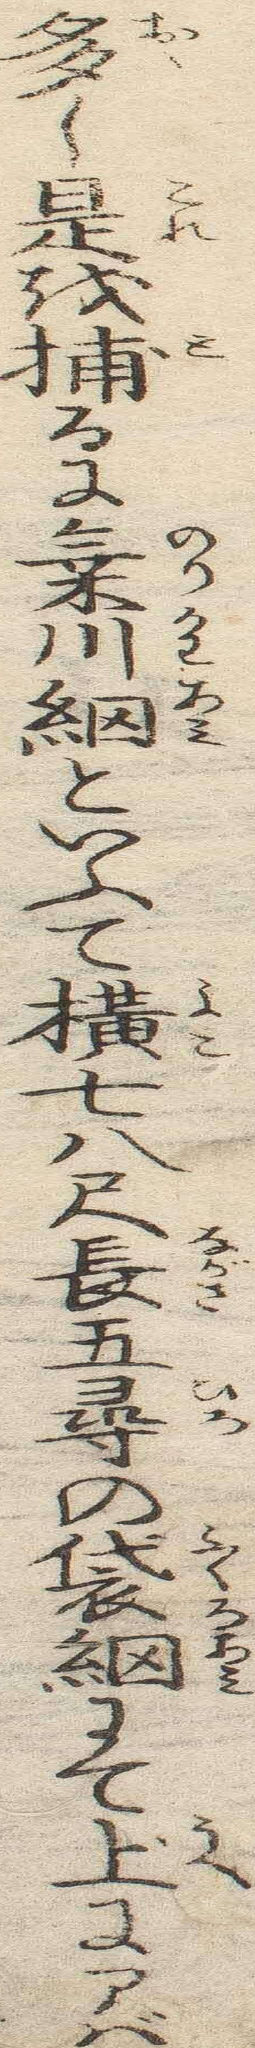多し是を捕るに乗川網といふて横七八尺長五尋の袋網にて上にアバ
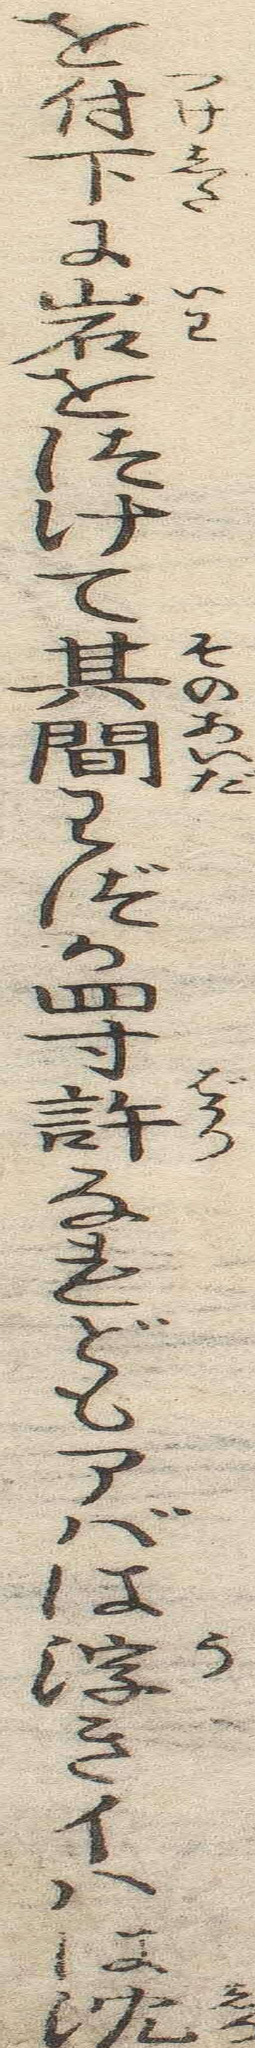を付け下に岩をつけて其間わづか四寸許なれどもアバは浮きイハは沈
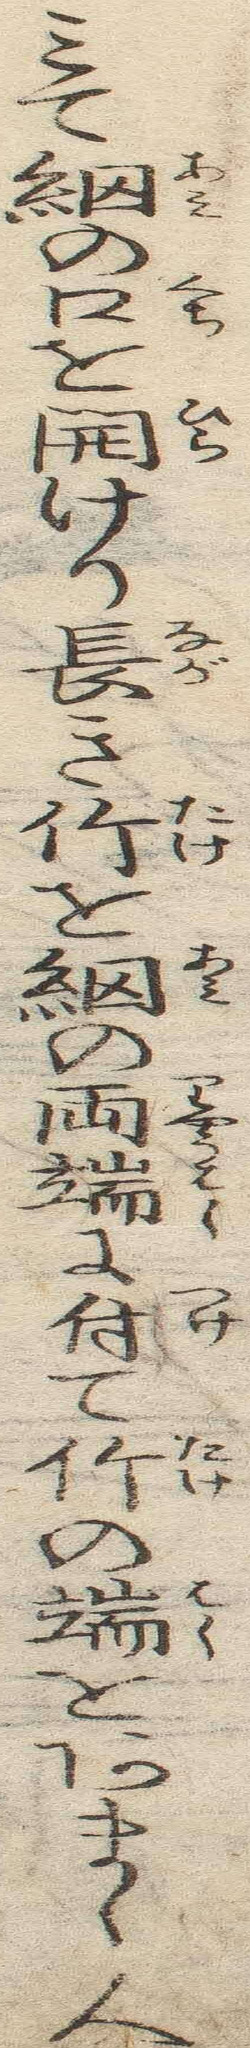みて網の口を開けり長き竹を網の両端に付て竹の端をあまし人
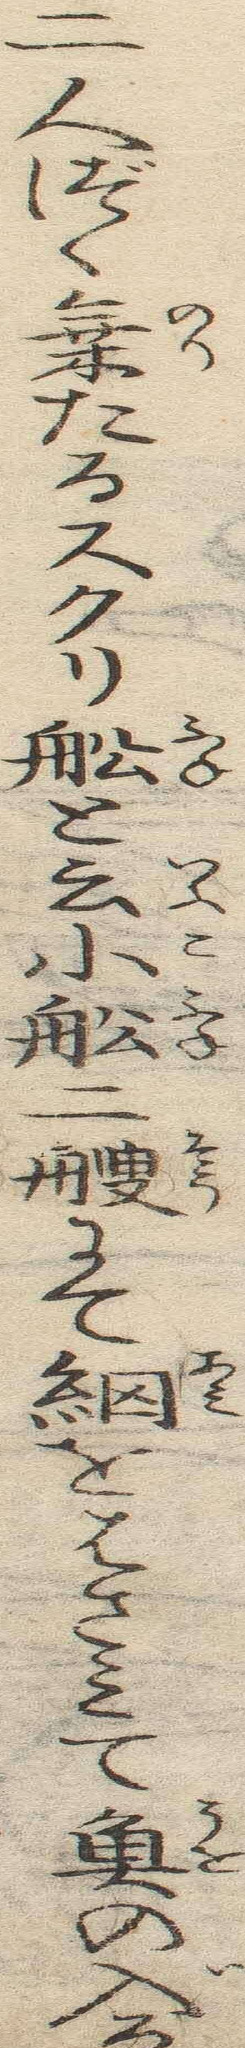二人づゝ乗たるスクリ船と云小船二艘にて網をはさみて魚の入る
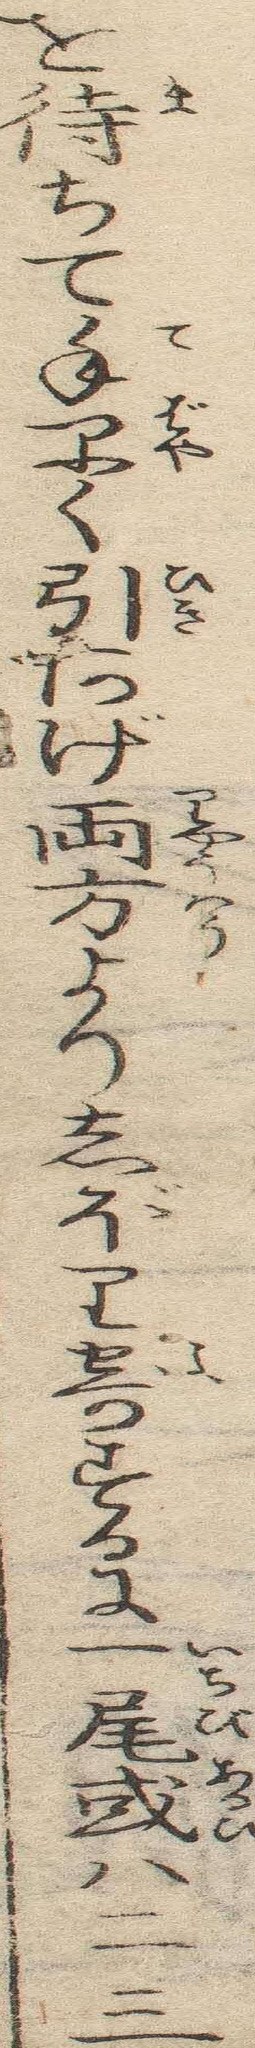を待ちて手早く引あげ両方よりしぼり寄するに一尾或は二三

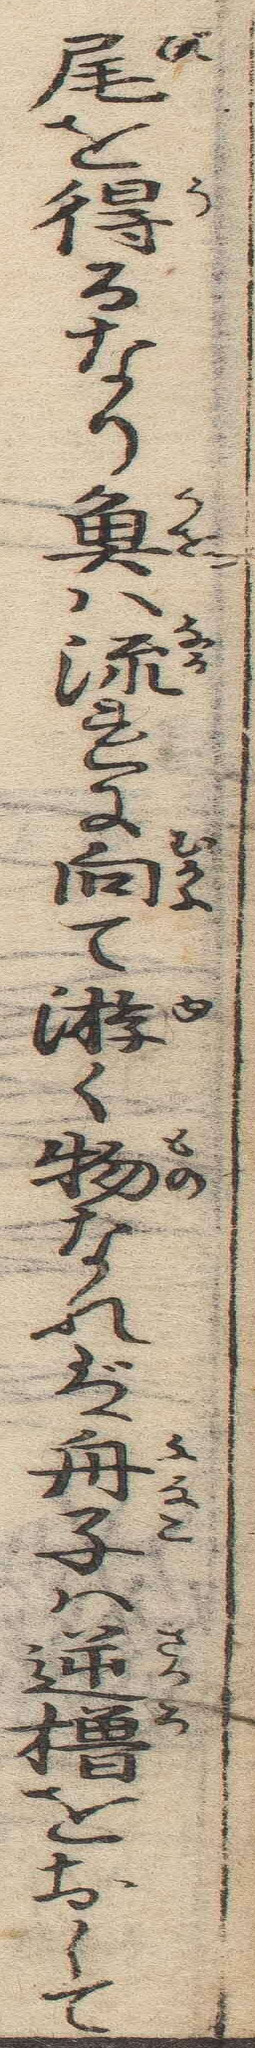尾を得るなり魚は流れに向て游く物なれば舟子は逆櫓をおして
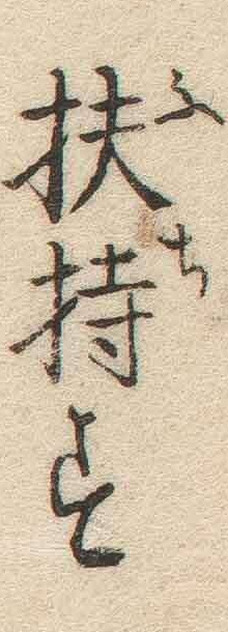扶持す
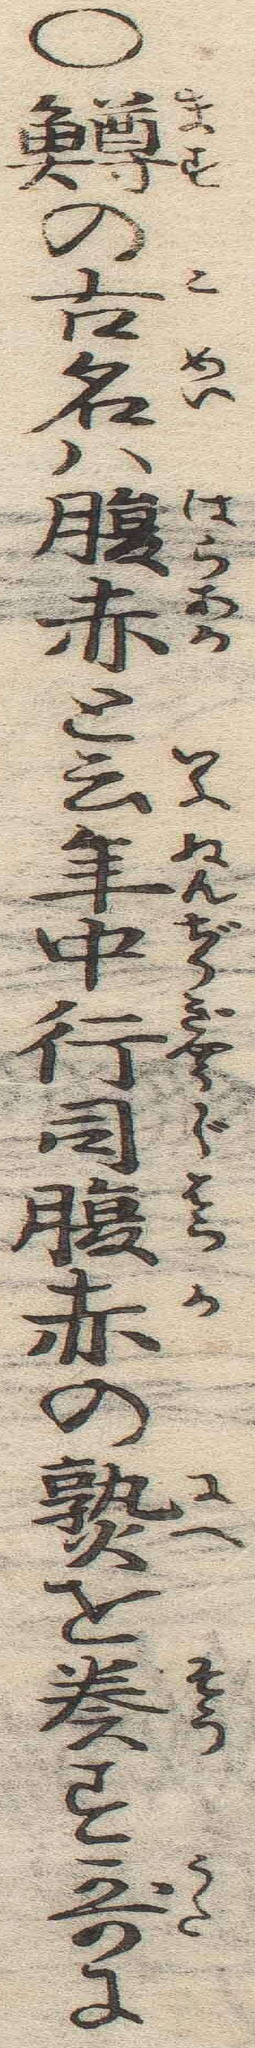○鱒の古名は腹赤と云年中行司赤腹の熟を奏す哥に
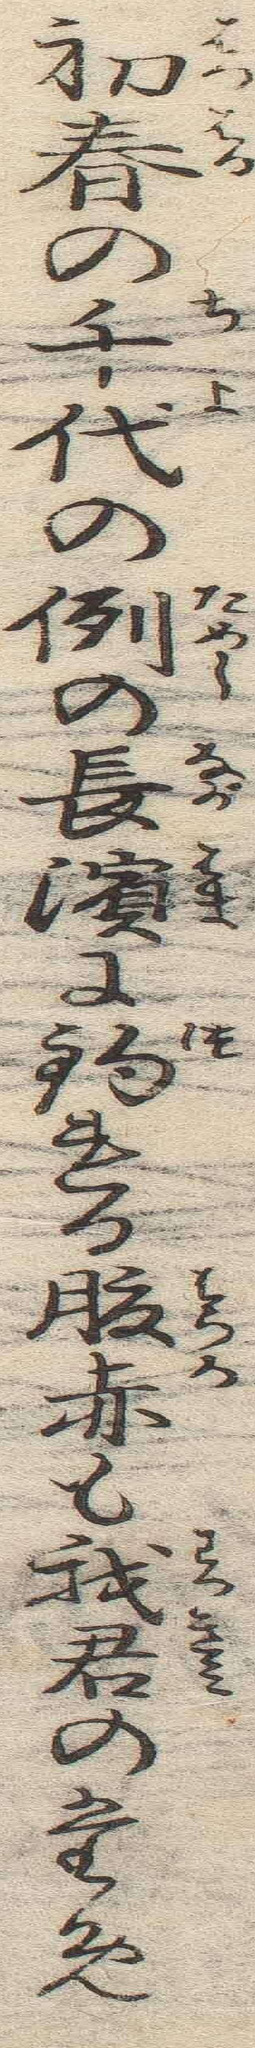初春の千代の例の長浜に釣れる腹赤も我君のため
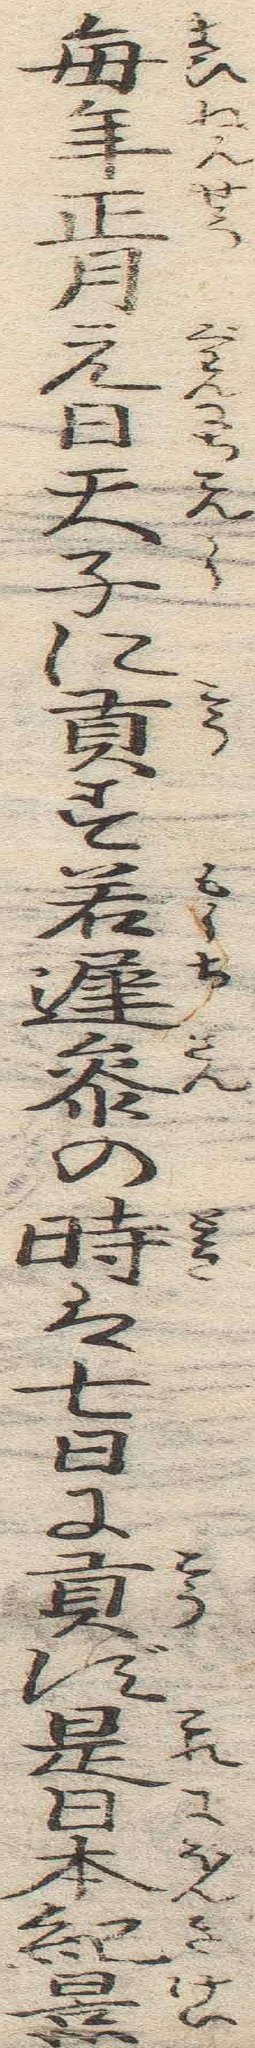毎年正月元旦天子に貢す若遅参の時は七日に貢ず是日本紀景
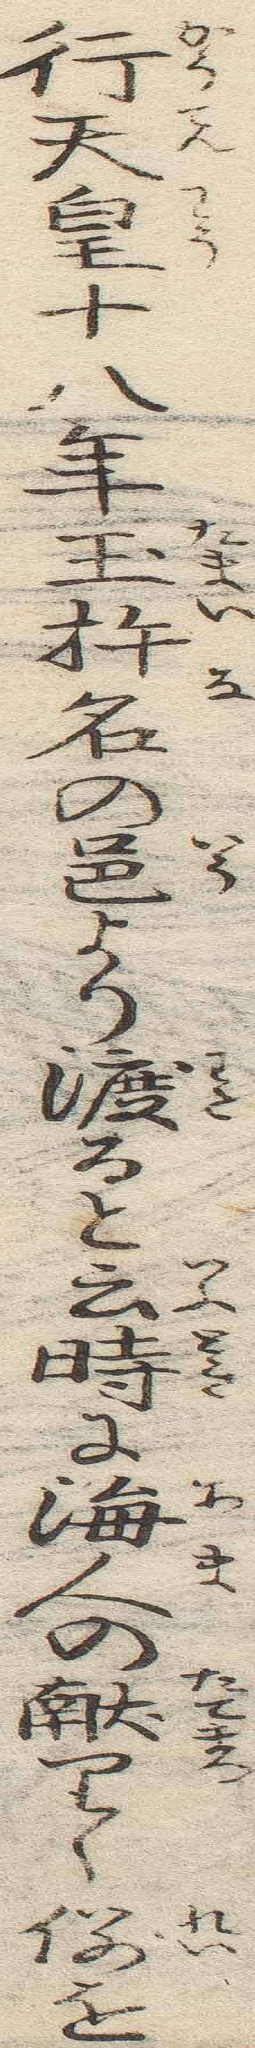行天皇十八年玉杵名の邑より渡ると云時に海人の献りし例を
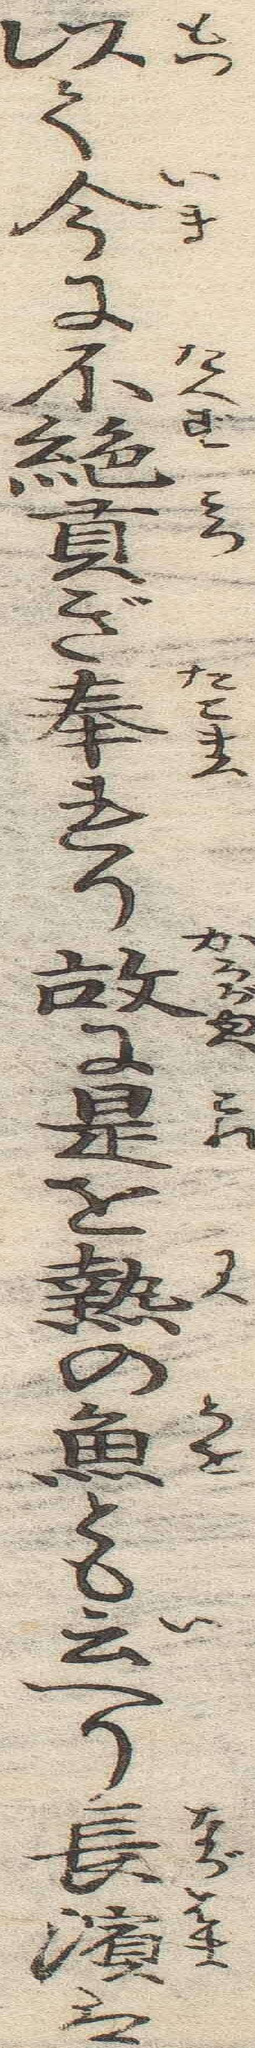以て今に不絶貢ぎ奉れり故に是を熱の魚とも云へり長浜は
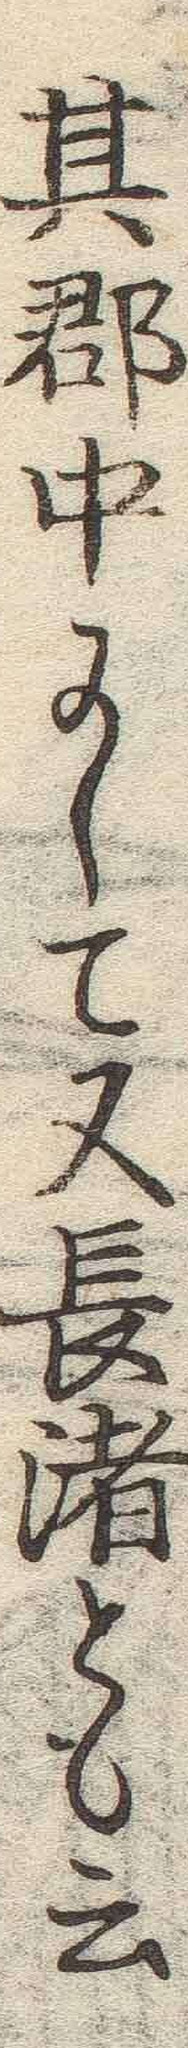其郡中にして又長渚とも云
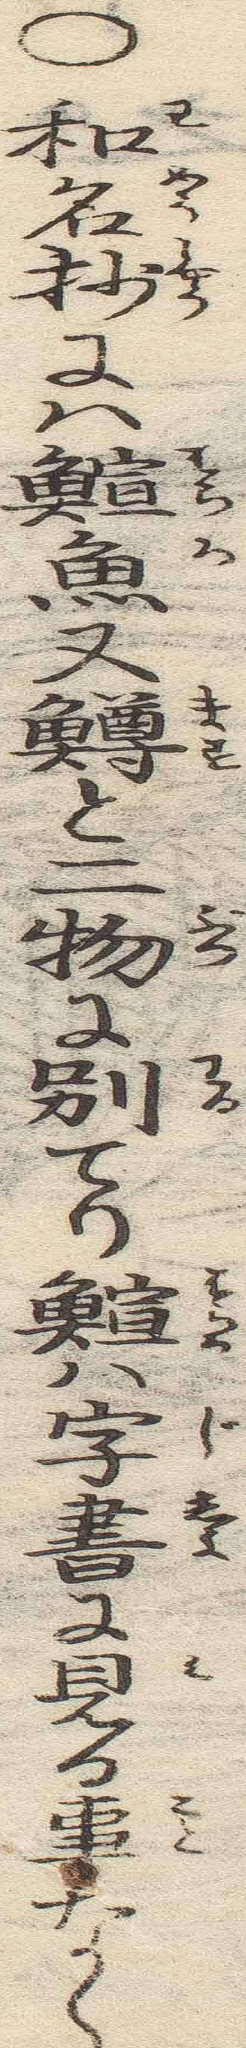○和名抄には鰚魚又鱒と二物に別てり鰚は字書に見る事なし
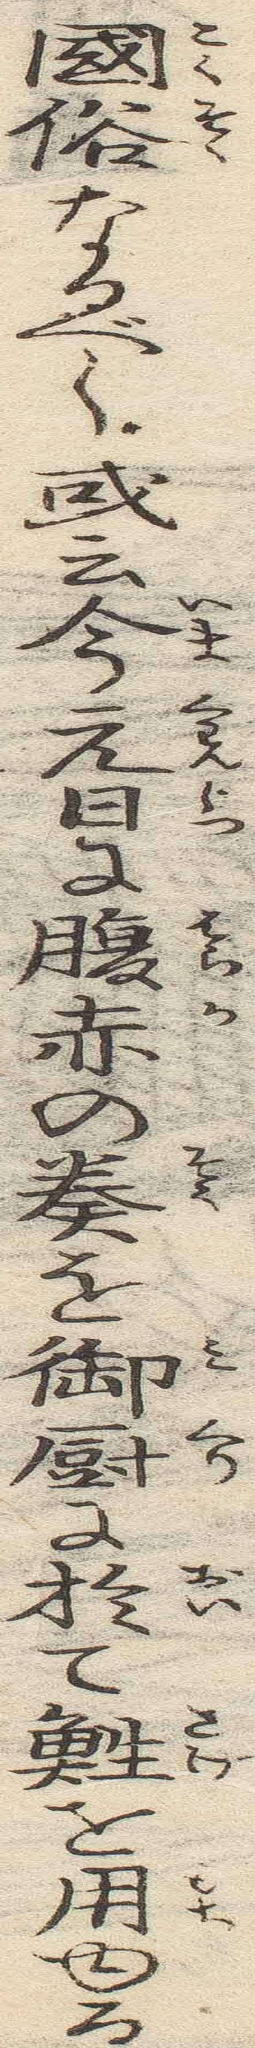国俗なるべし或云今元日に腹赤の奏を御厨に於て鮭を用ゆる
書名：日本山海名産図会
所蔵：東京学芸大学附属図書館 国文学研究資料館
